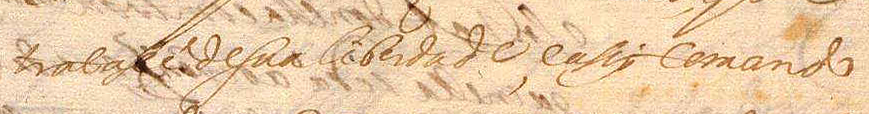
tratassē de sua liberdade, e assy tomando
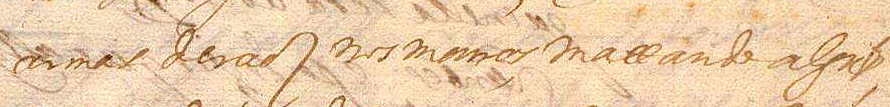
armas deraõ nos mouros, mattando algūs,
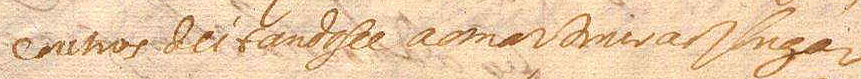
e outros deitandosse ao mar, tiueraõ lugar
